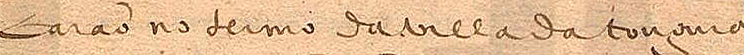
caraõ no termo da villa datouguia
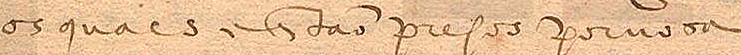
os quaes estaõ presos por uosa
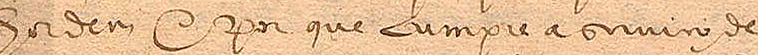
hordem e porque cumpre a seruiço de
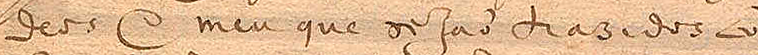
deos e meu que seJaõ trazidos cō
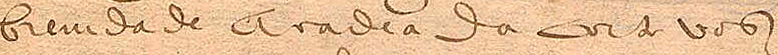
breuidade a cadea da corte vos
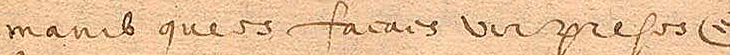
mando que os façaes vir presos ē
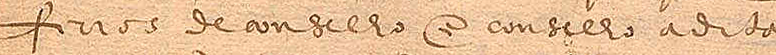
ferros de conselho ē conselho a dita
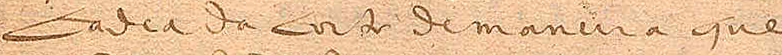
Cadea da corte de maneira que
